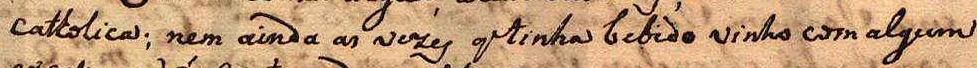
catholica; nem ainda as vezes q̄ tinha bebido vinho com algum
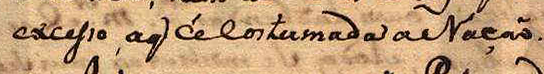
excesso, a q̄ he costumada a Naçaõ.
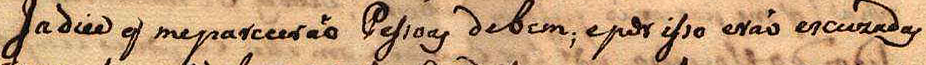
Ja dice q̄ me pareceraõ Pessoas de bem; e por isso eraõ escuzadas
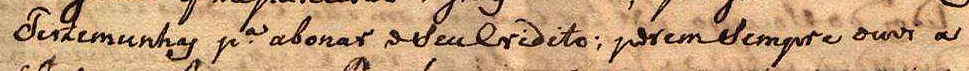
Testemunhas p.a abonar o seu Credito; porem sempre ouvi a
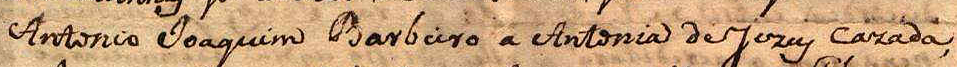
Antonio Ioaquim Barbeiro a Antonia de Jezus cazada,
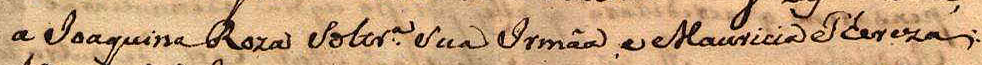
a Ioaquina Roza Soltr.a sua Irmãa e Mauricia Thereza;
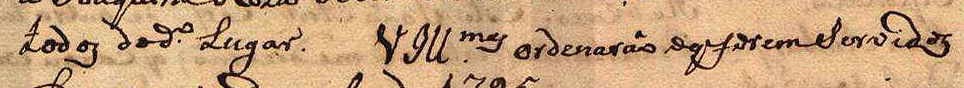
todos do d.o Lugar. V Ill.mas ordenaraõ o q̄ forem Servidos
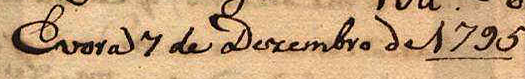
Evora 7 de Dezembro de 1795
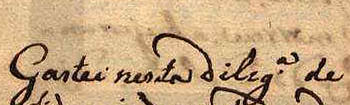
Gastei nesta dilig.a de
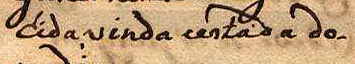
hida, vinda e estada do
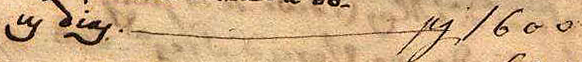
us dias – pg 1600
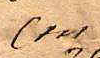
Ctas
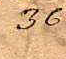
36
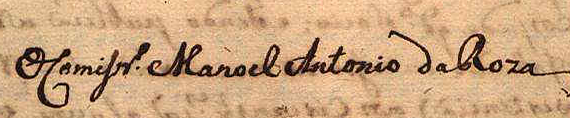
O Comissr.o Manoel Antonio da Roza
